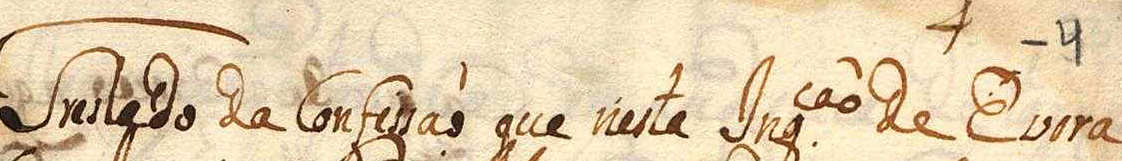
Treslado da Confissaõ que nesta Inq.cão de Evora
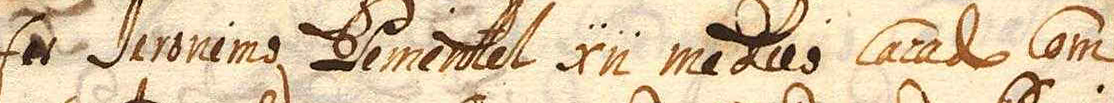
fes Jeronimo Pementel xn medico Cazado Com
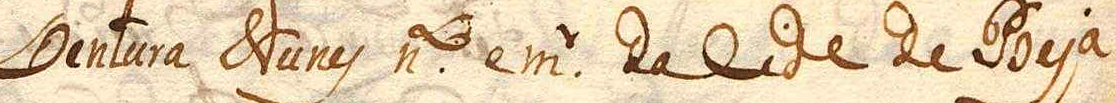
Ventura Nunes n.l e m.r da Cide de Beja
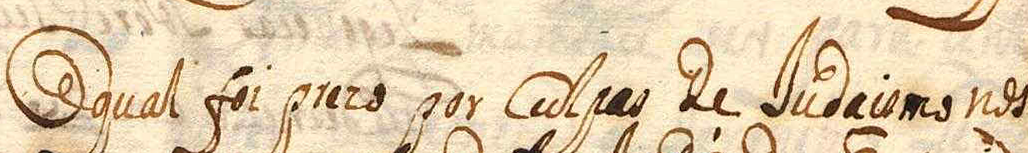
O qual foi prezo por Culpas de Judaismo nos
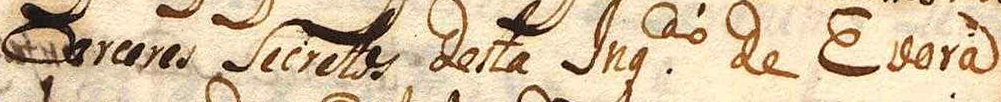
Carceres Secretos desta Inq.caõ de Evora
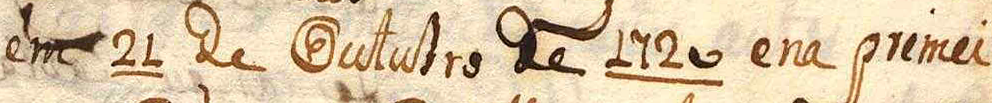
em 21 de Outubro de 1720 e na primei
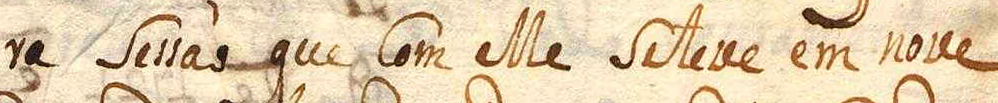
ra Sessão que Com elle se teve em nove
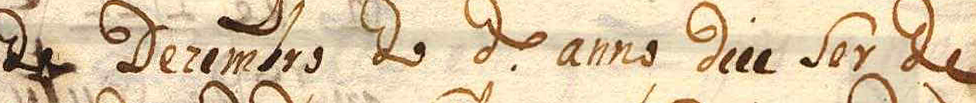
de Dezembro do d.o anno dice ser de
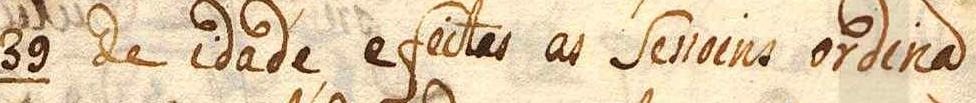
39 de idade e feitas as sessoins ordina
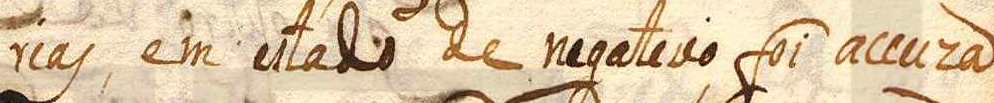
rias, em estado de negativo foi accuza
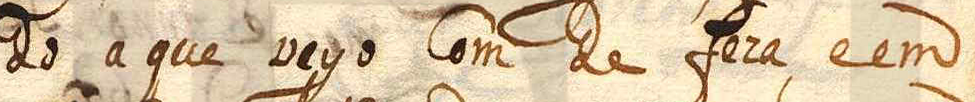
do a que veyo Com defeza, e em
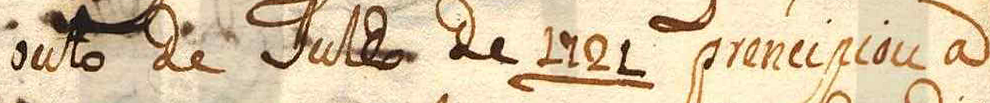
outo de Julho de 1721 prencipiou a
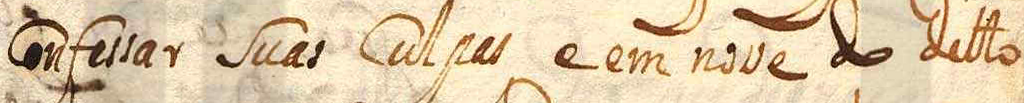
confessar suas Culpas e em nove do ditto
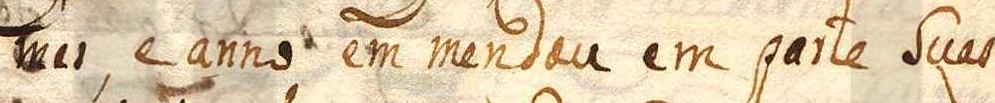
mes, e anno emmendou em parte suas
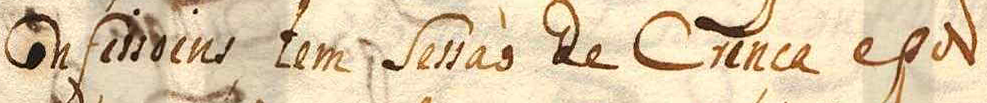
Confissoins tem Sessaõ de Crença e por
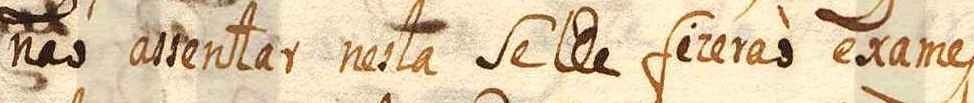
naõ assentar nesta Se lhe fizeraõ exames
